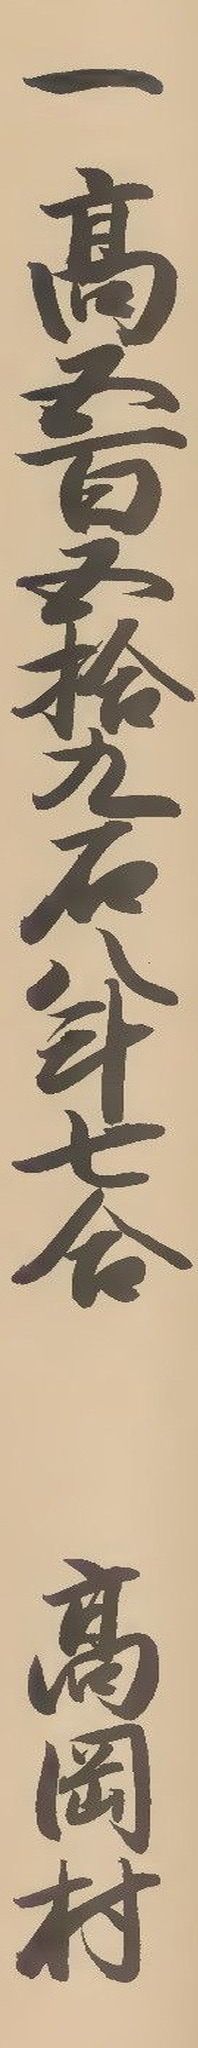一高五百五拾九石八斗七合高岡村
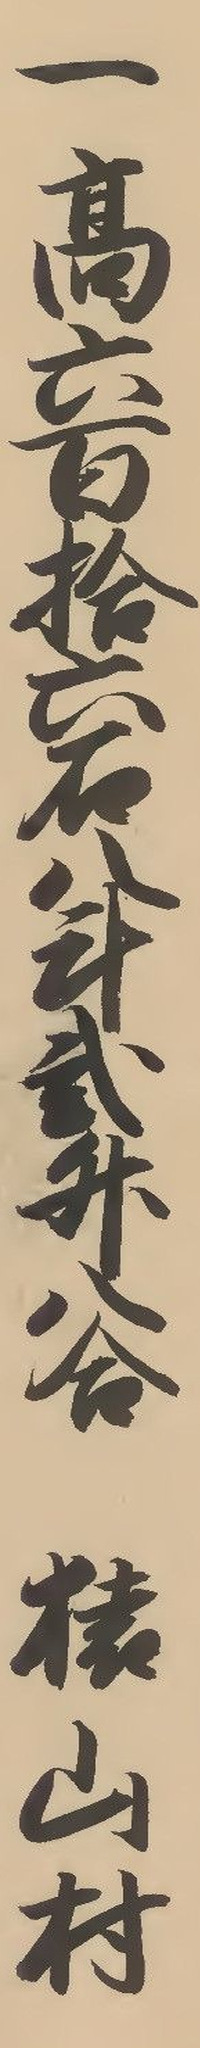一高六百拾六石八斗弐升八合猿山村
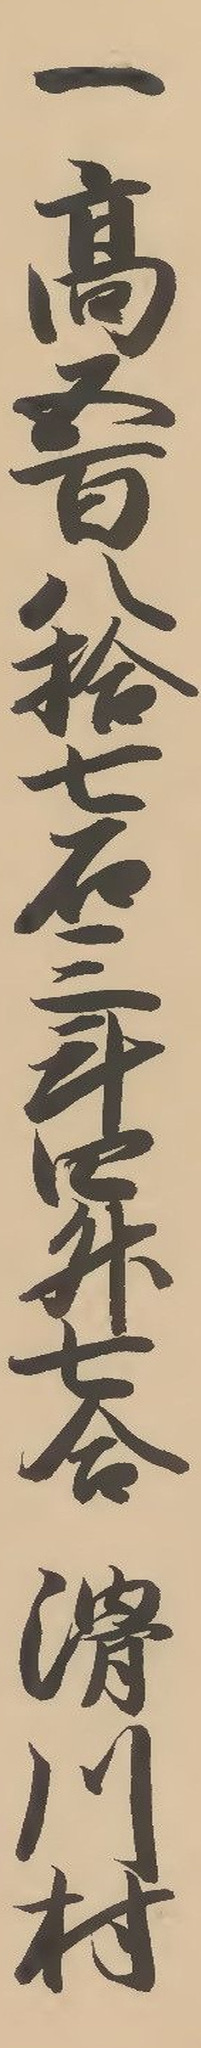一高五百八拾七石三斗四升七合滑川村
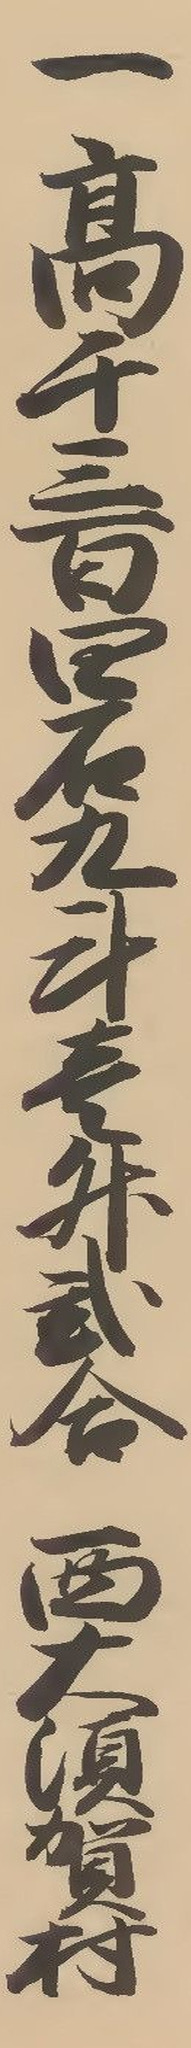一高千三百四石九斗壱升弐合西大須賀村

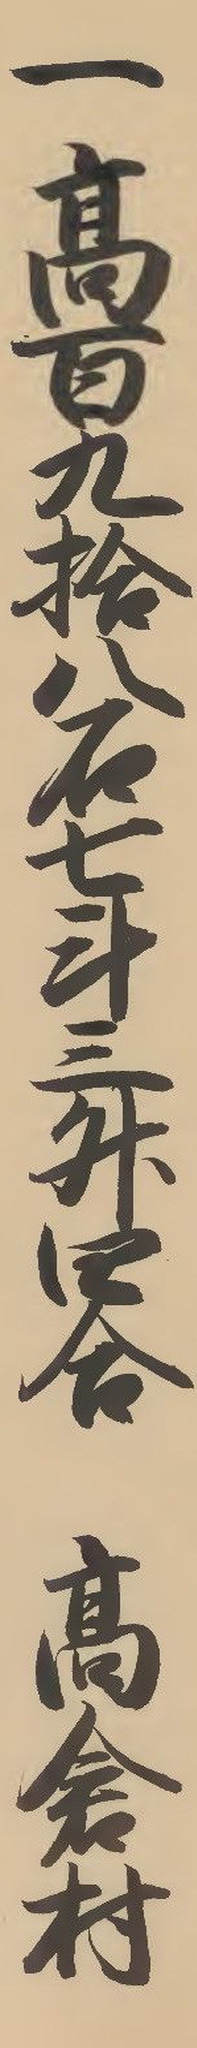一高百九拾八石七斗三升四合高倉村
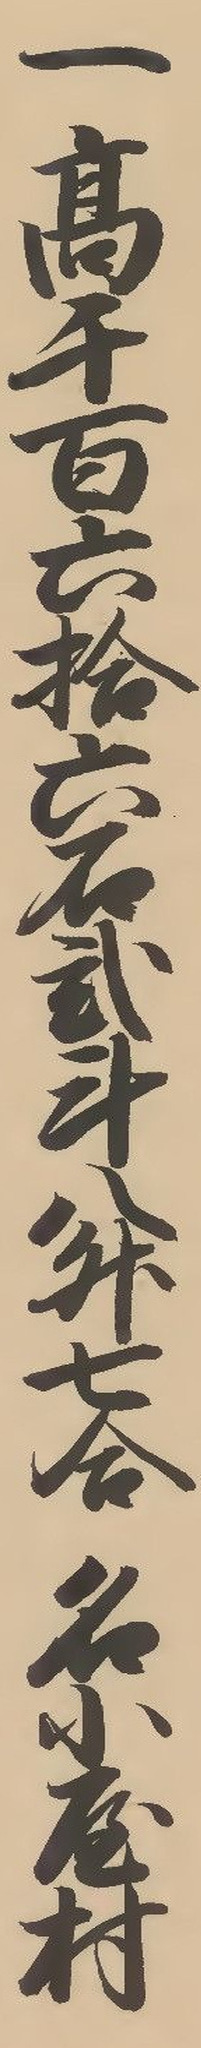一高千百六拾六石弐斗八升七合名小屋村
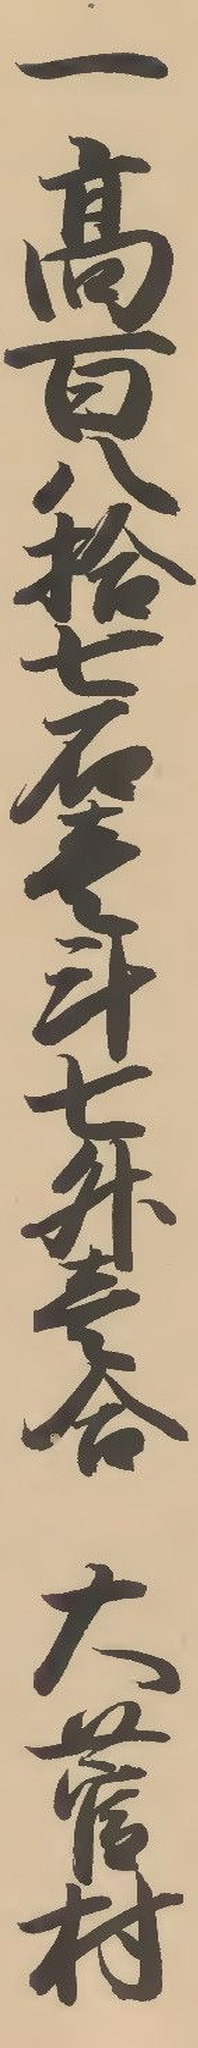一高百八拾七石壱斗七升壱合大菅村
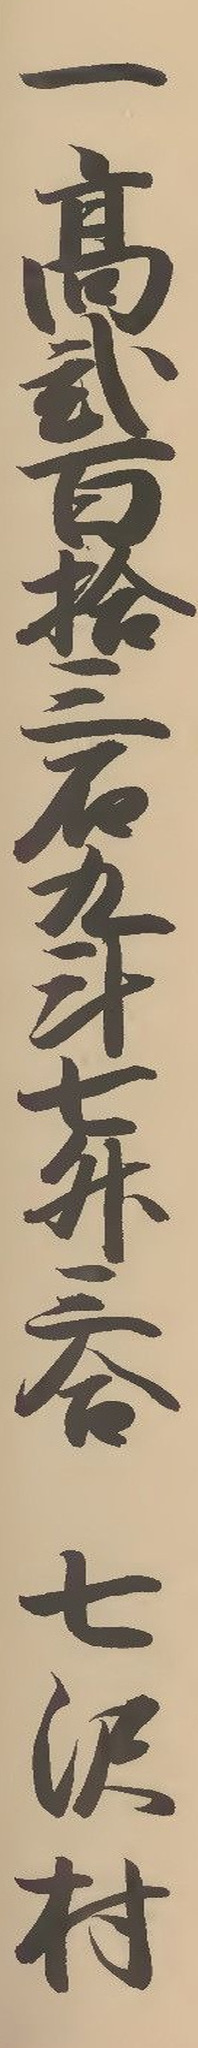一高弐百拾三石九斗七升三合七沢村
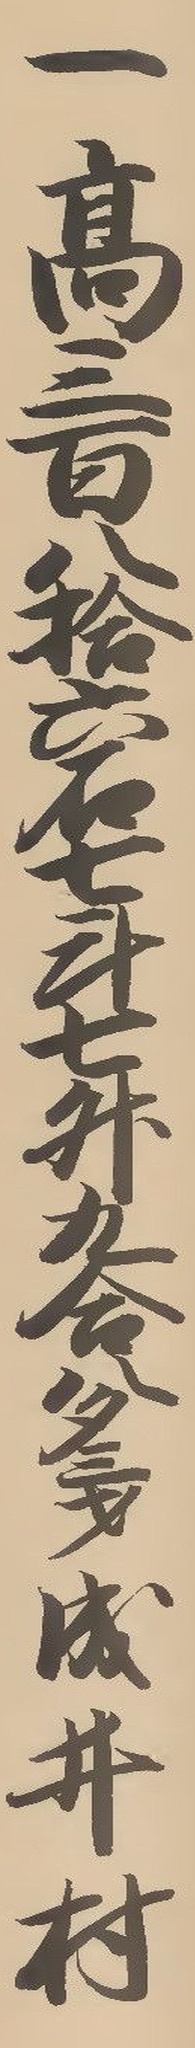一高三百八拾六石七斗七升九合八勺三才成井村
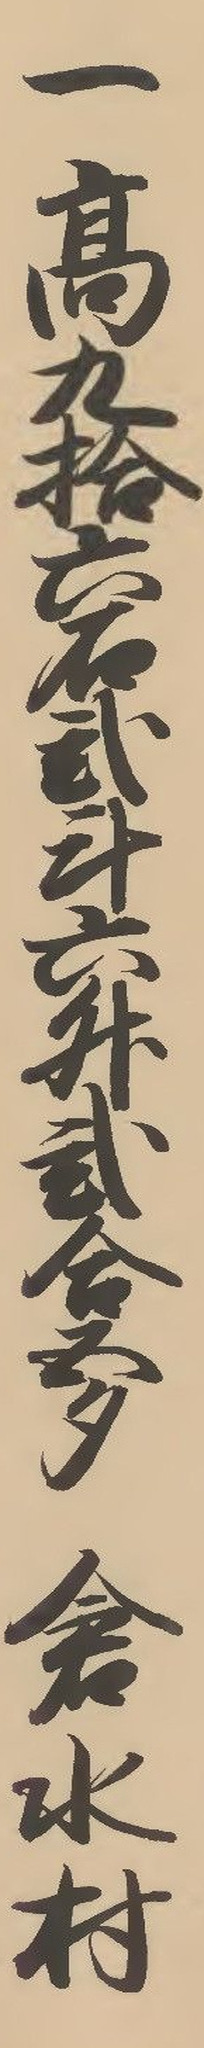一高九拾六石弐斗六升弐合五勺倉水村
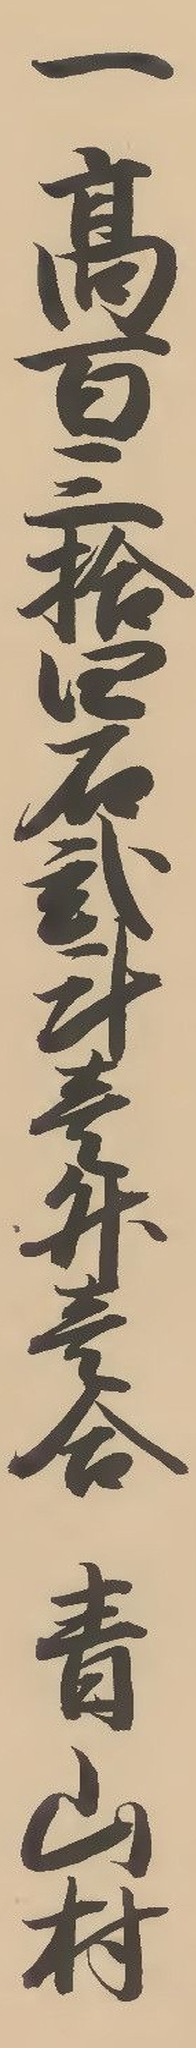一高百三拾四石弐斗壱升壱合青山村
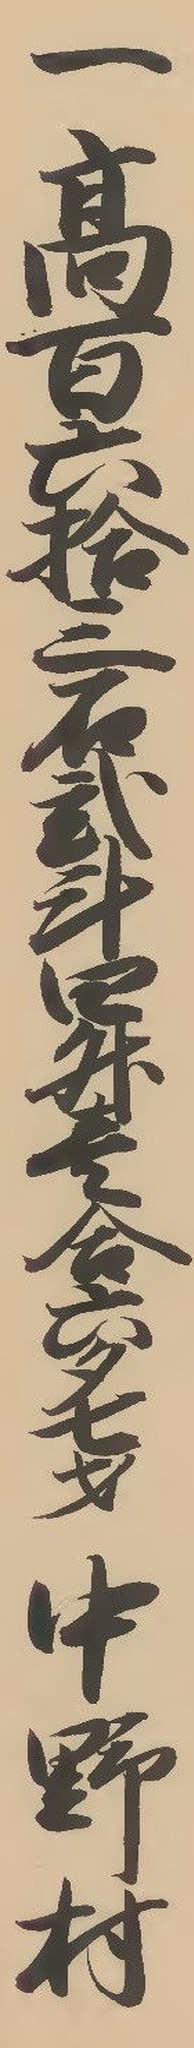一高百六拾三石弐斗四升壱合六勺七才中野村

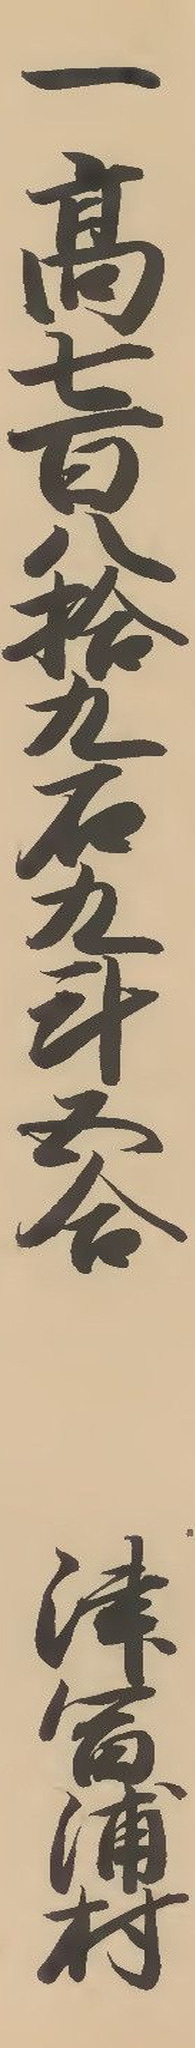一高七百八拾九石九斗五合津富浦村
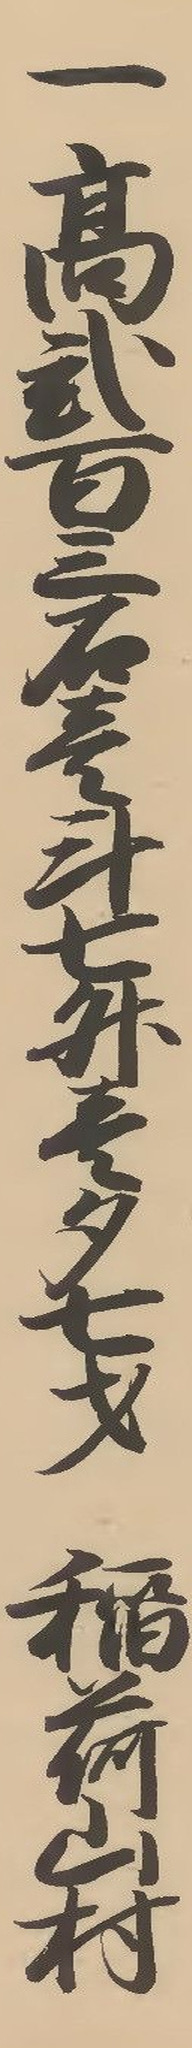一高弐百三石壱斗七升壱勺七才稲荷山村
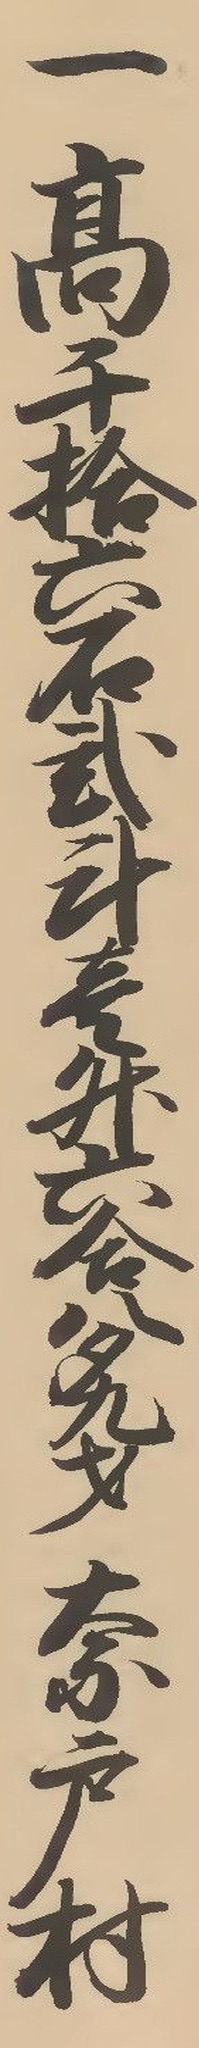一高千拾六石弐斗壱升六合八勺九才奈戸村
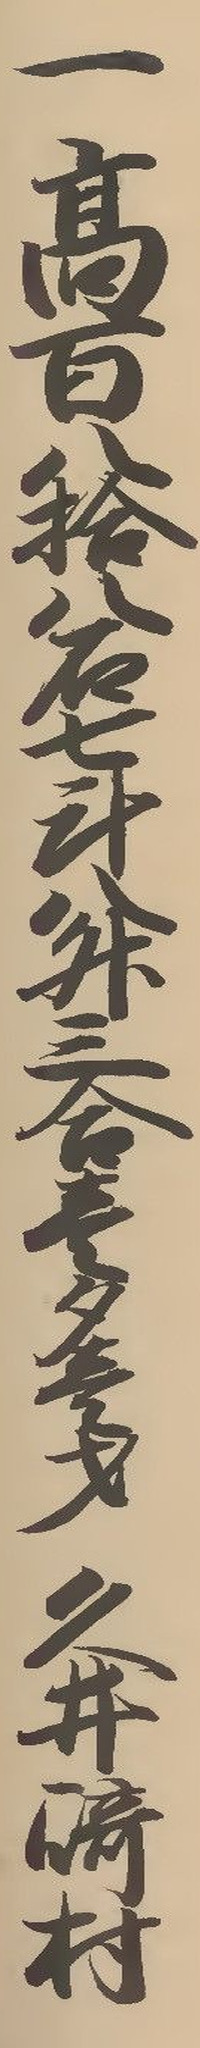一高百八拾八石七斗八升三合壱夕壱才久井崎村
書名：下総国郷帳
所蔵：国立公文書館 National Archives of Japan
